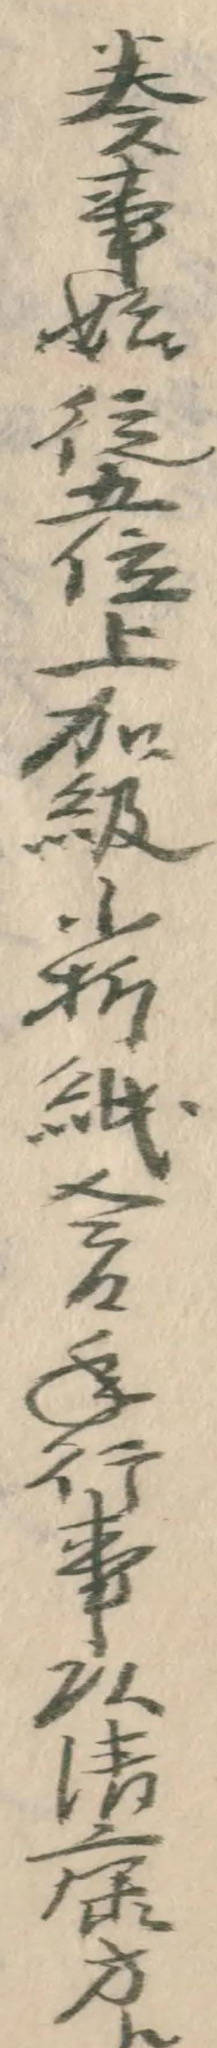奏事始従五位上加級小折紙今日年行事頭清康方え
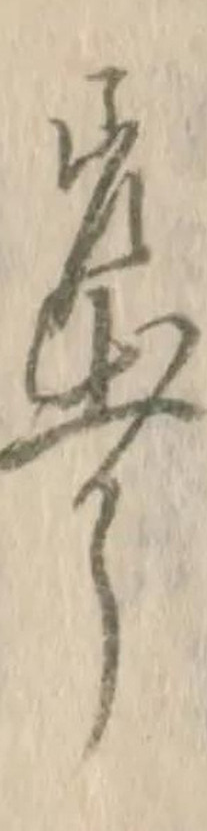差出了
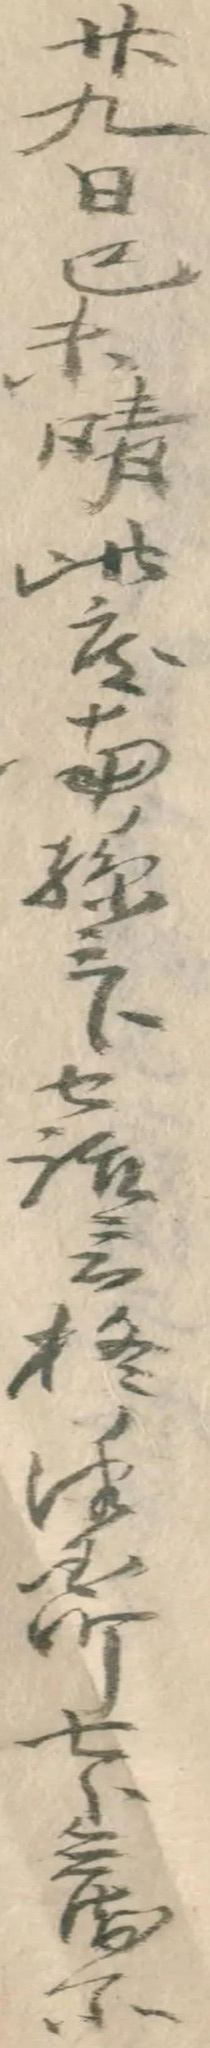廿九日巳未晴此度南ノ孫三郎世話ニ而柊ノ津国町七郎兵衛所
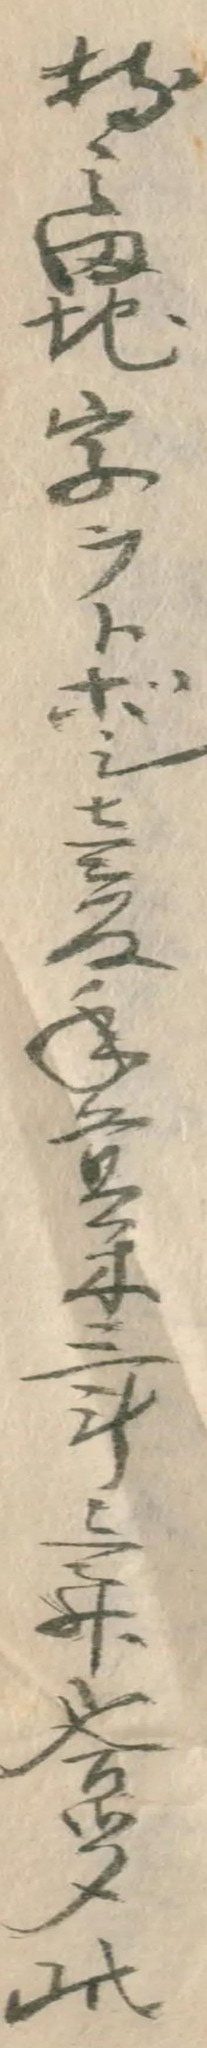持之田地字ヲトボシ壱反年貢米三斗ニ升弐合弐勺此

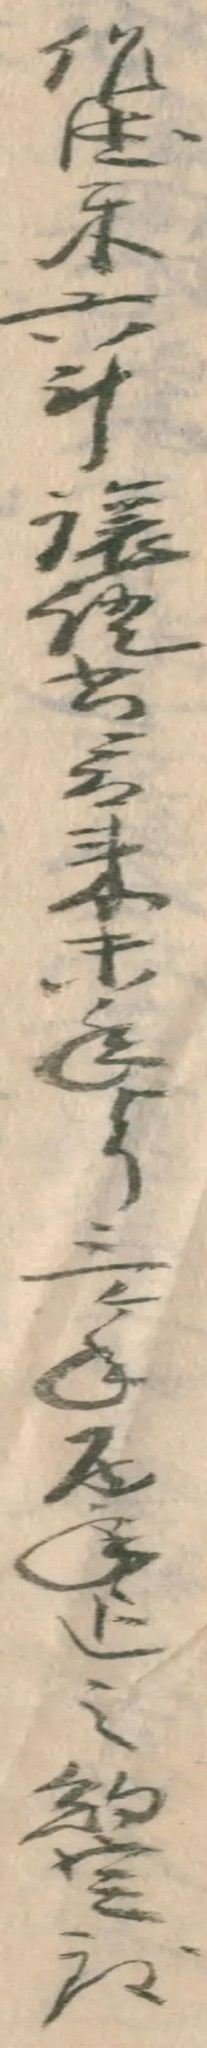作徳来六斗譲證書ニ而来未年より三ヶ年酉年迄之約定致
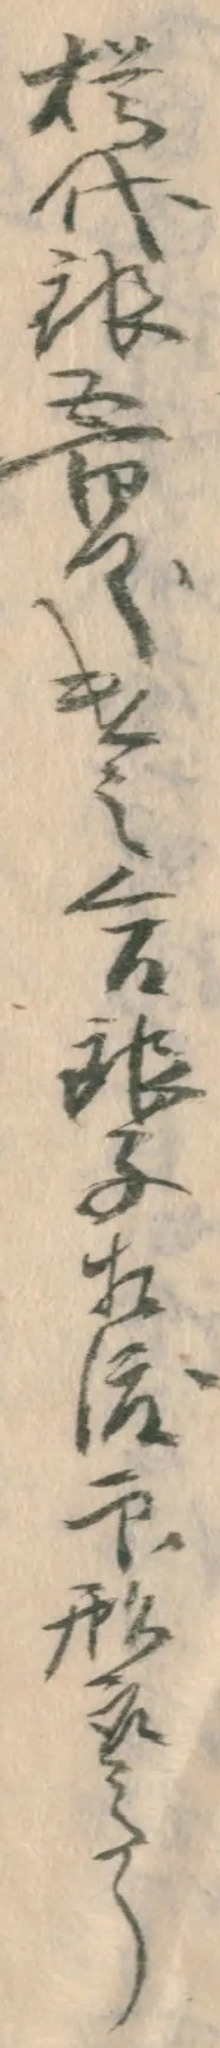樽代銀五百匁遣之今日銀子相渡印形取之了
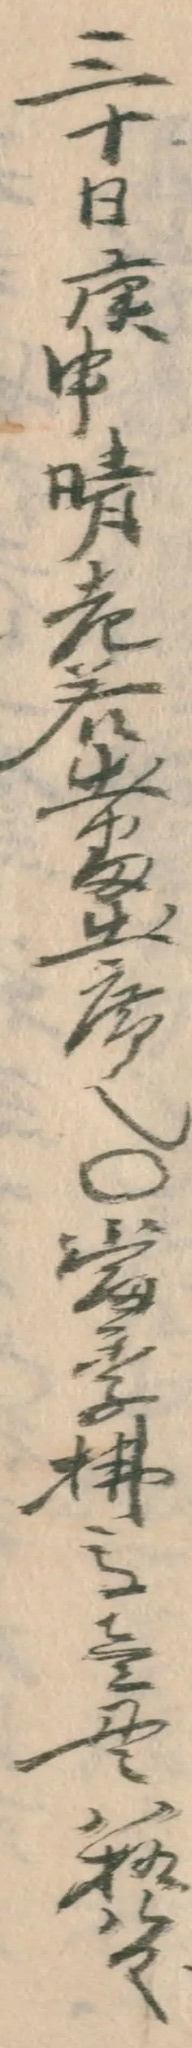三十日庚申晴老若出番出席也〇當季払高壱貫八拾八匁
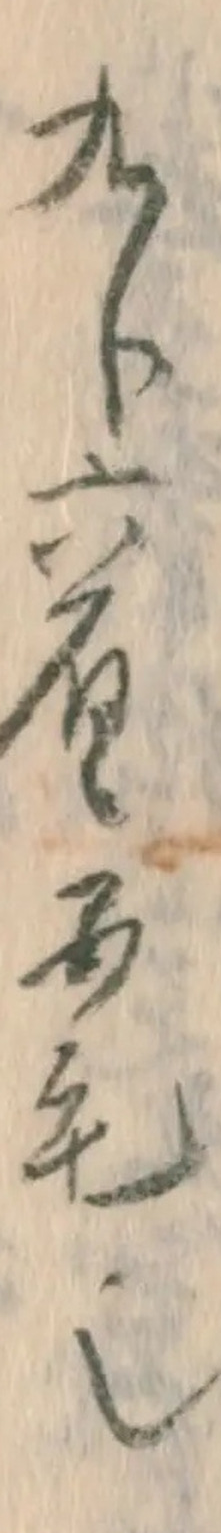九分六厘五毛也
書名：賀茂社記録. 第66冊
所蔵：国立国会図書館 National Diet Library, JAPAN
